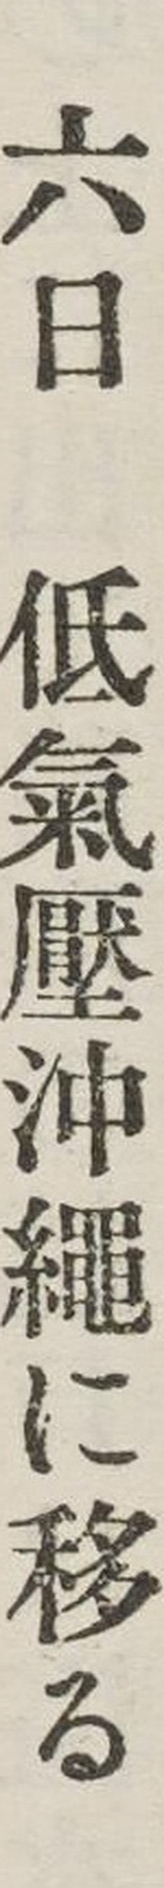六日低気圧沖縄に移る
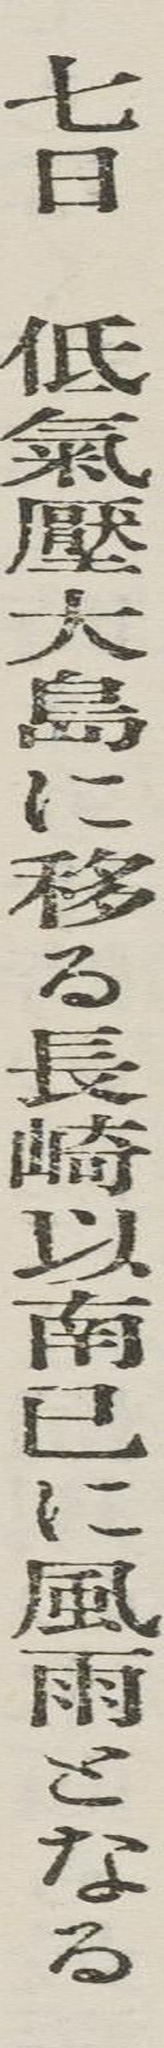七日低気圧大島に移る長崎以南已に風雨となる
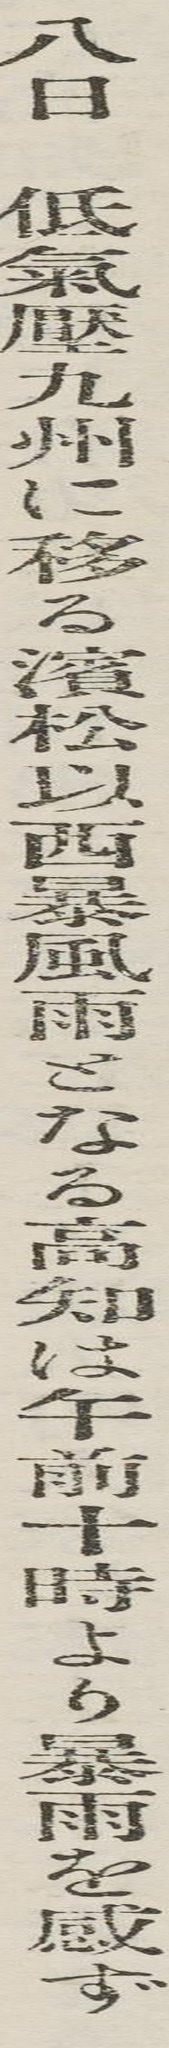八日低気圧九州に移る浜松以西暴風雨となる高知は午前十時より暴雨を感ず
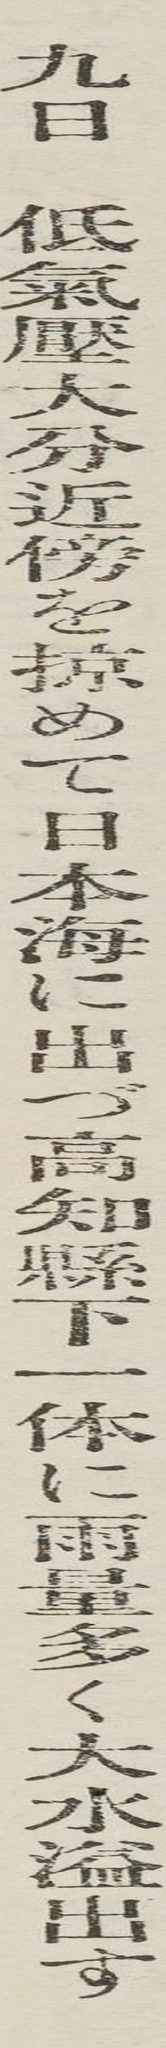九日低気圧大分近傍を掠めて日本海に出づ高知県下一体に雨量多く大水溢出す
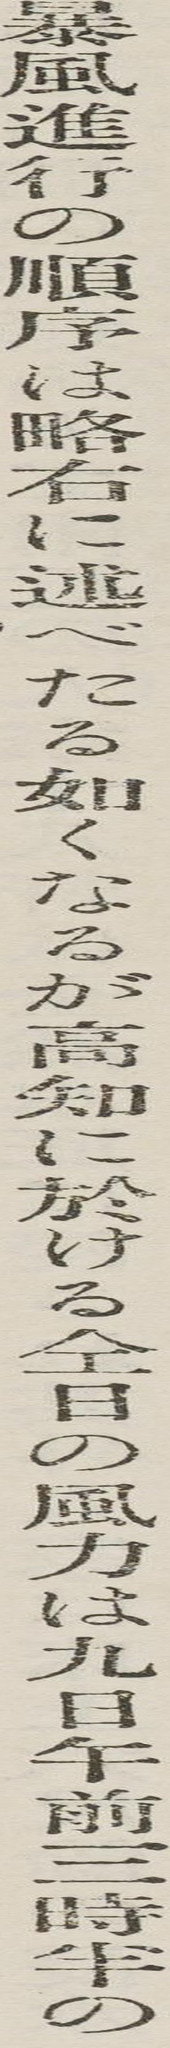暴風進行の順序は略右に述べたる如くなるが高知に於ける同日の風力は九日午前三時半の
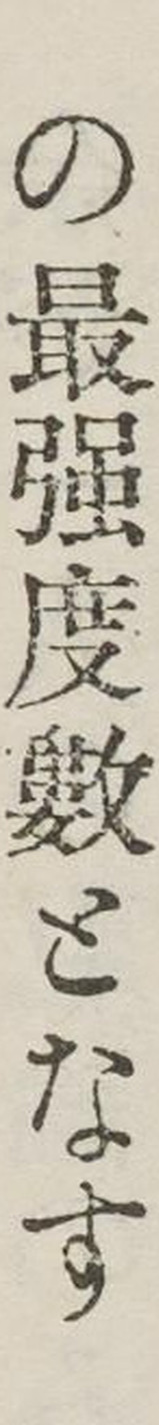の最強度数となす
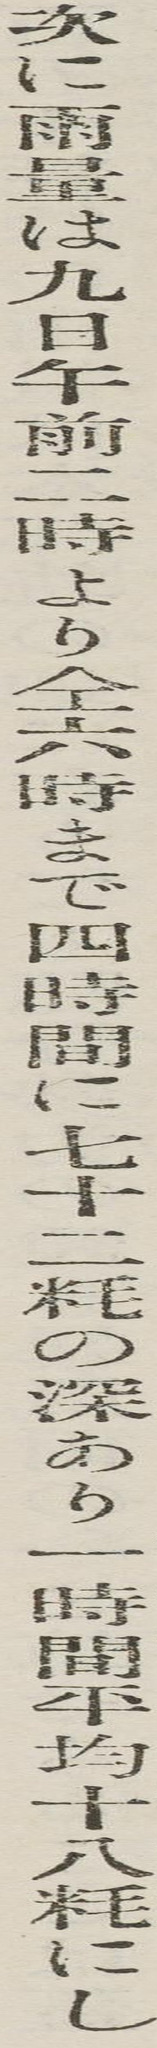次に雨量は九日午前二時より同六時まで四時間に七十二粍の深あり一時間平均十八粍にし
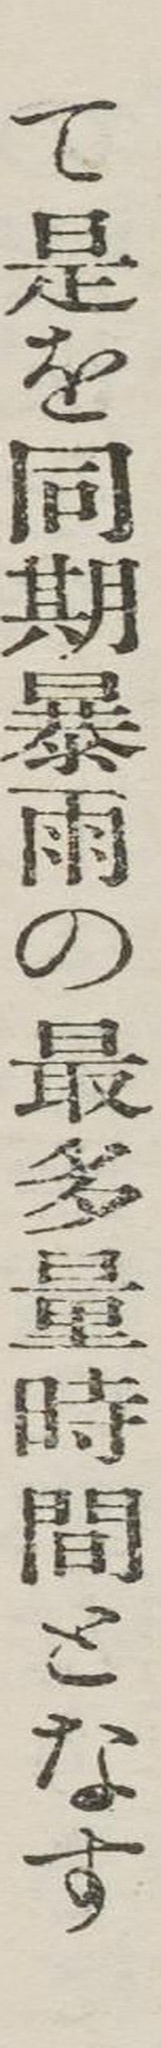て是を同期暴雨の最多量時間となす
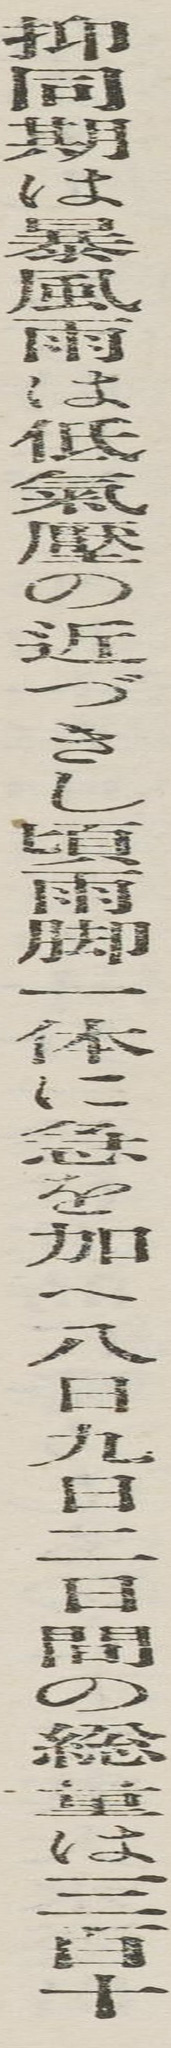抑同期は暴風雨は低気圧の近づきし頃雨脚一体に急を加へ八日九日二日間の総量は三百十
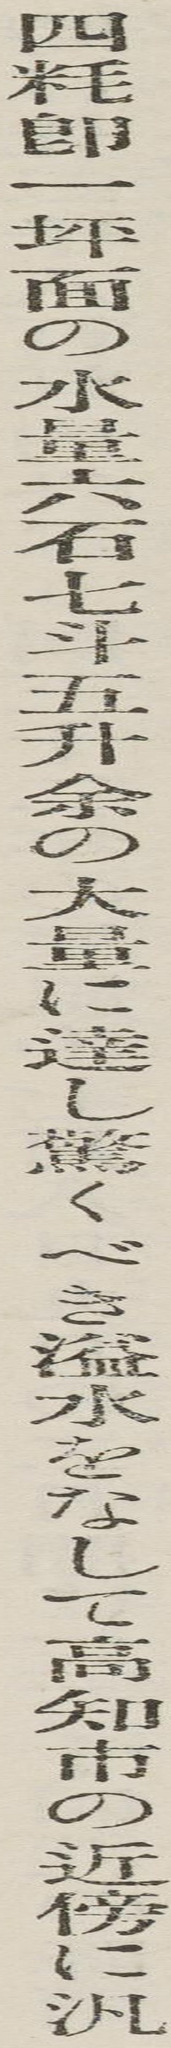四粍即一坪面の水量六石七斗五升余の大量に達し驚くべき溢水をなして高知市の近傍に汎
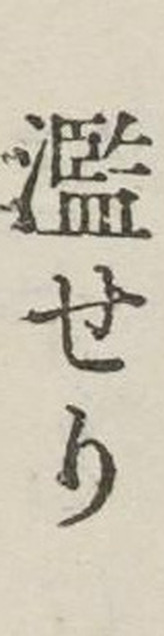濫せり

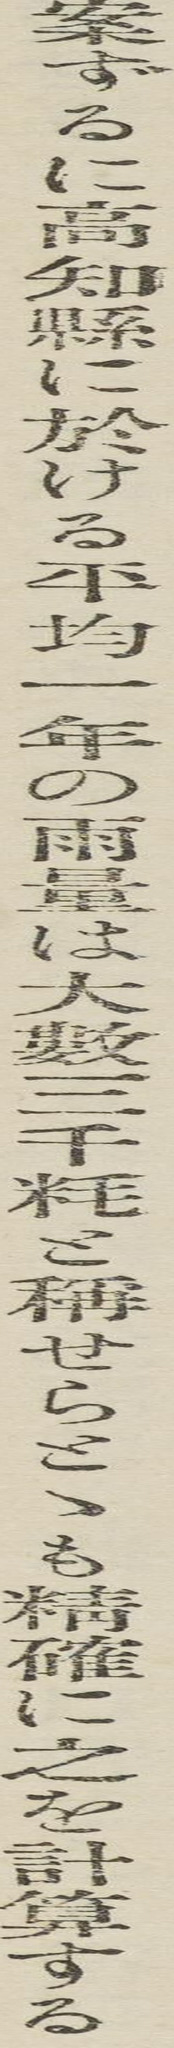案ずるに高知県に於ける平均一年の雨量は大数三千粍と称せらとゝも精確に之を計算する
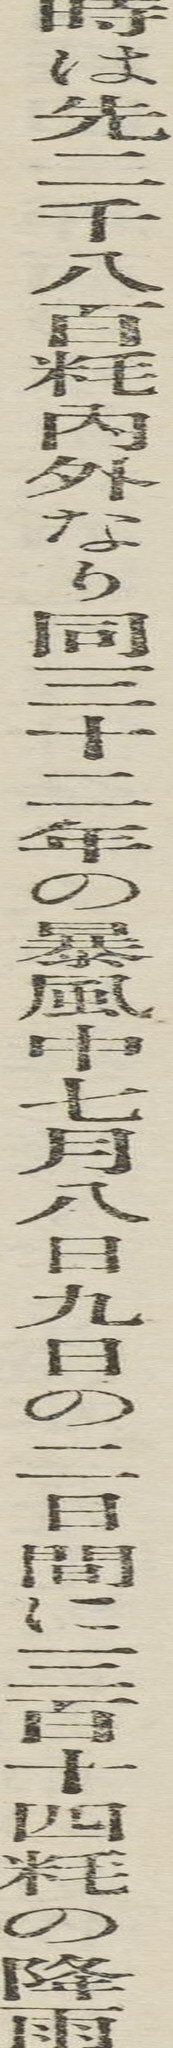時は先二千八百粍内外なり同三十二年の暴風中七月八日九日の二日間に三百十四粍の降雨
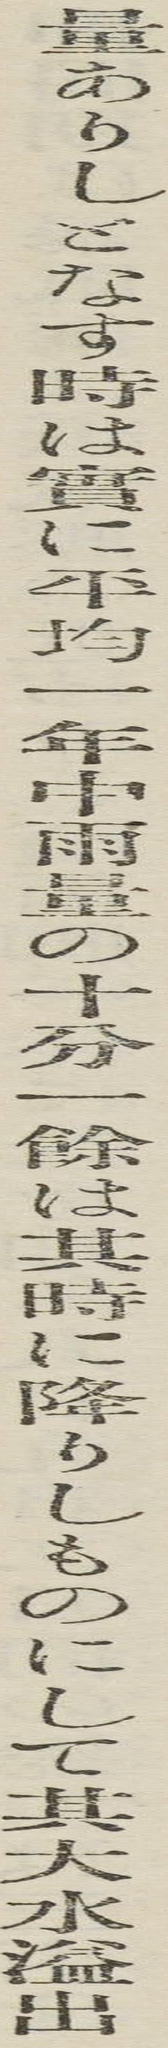量ありしとなす時は実に平均一年中雨量の十分一余は其時に降りしものにして其大水溢出
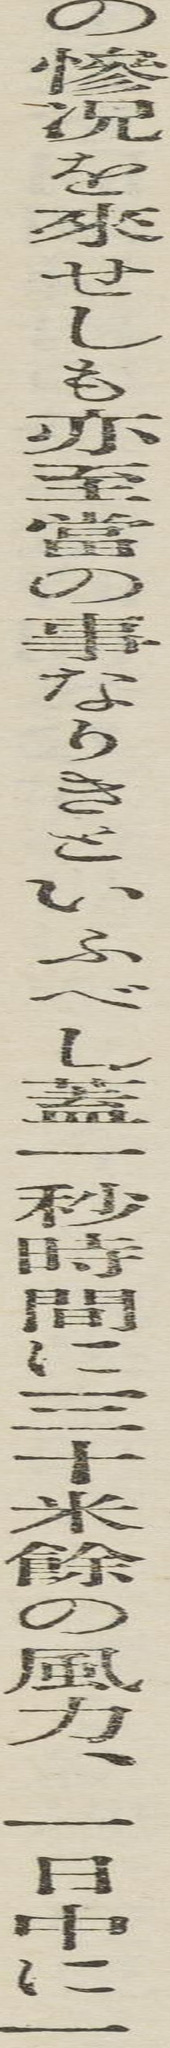の惨況を来せしも亦至当の事なりきといふべし蓋一秒時間に三十米余の風力、一日中に一
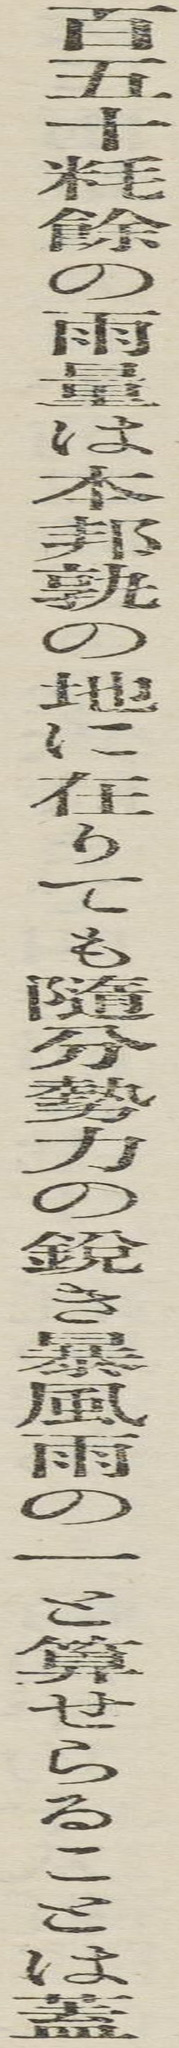百五十粍余の雨量は本邦孰の地に在りても随分勢力の鋭き暴風雨の一と算せらることは蓋
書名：土佐古今ノ地震
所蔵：東京大学地震研究所図書室 Earthquake Research Institute Library, The University of Tokyo, JAPAN
